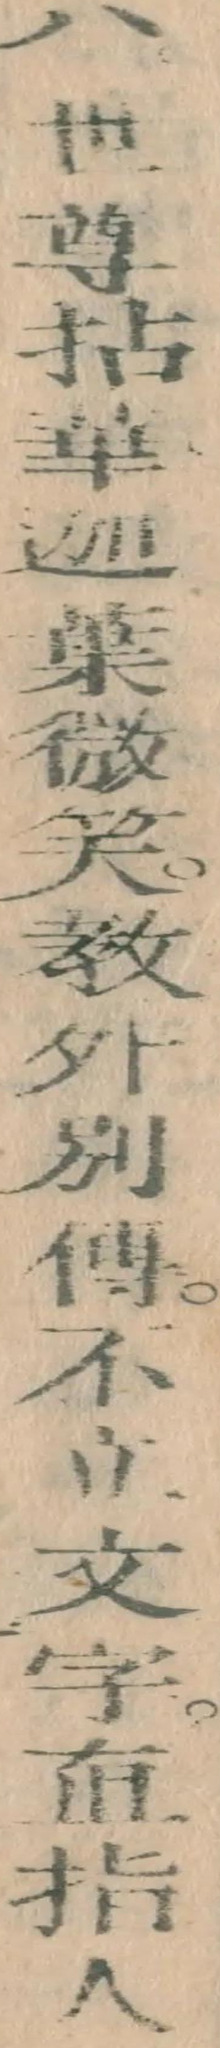ハ世尊拈華迦葉微笑。教外別伝。不立文字。直指人
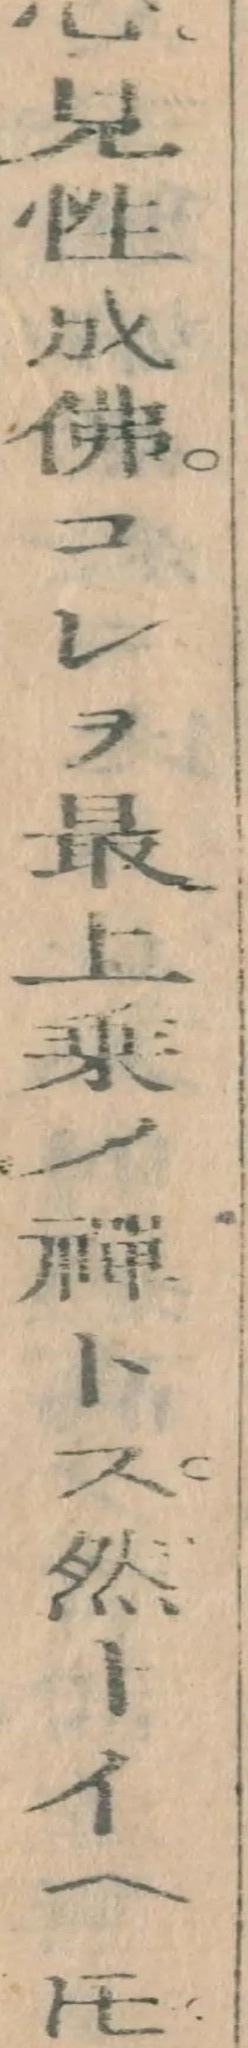心。見性成仏。コレヲ最上乗ノ禅トス。然トイヘトモ。

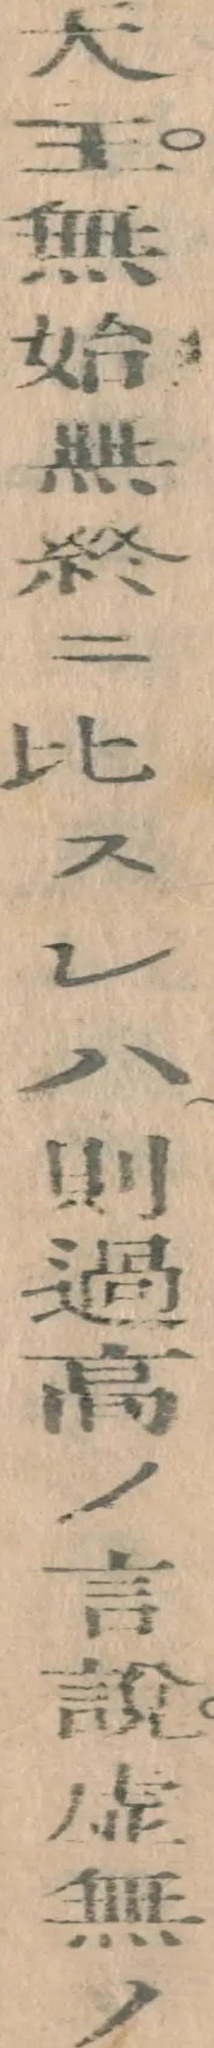天主。無始無終ニ比スレハ。則過高ノ言説。虚無ノ
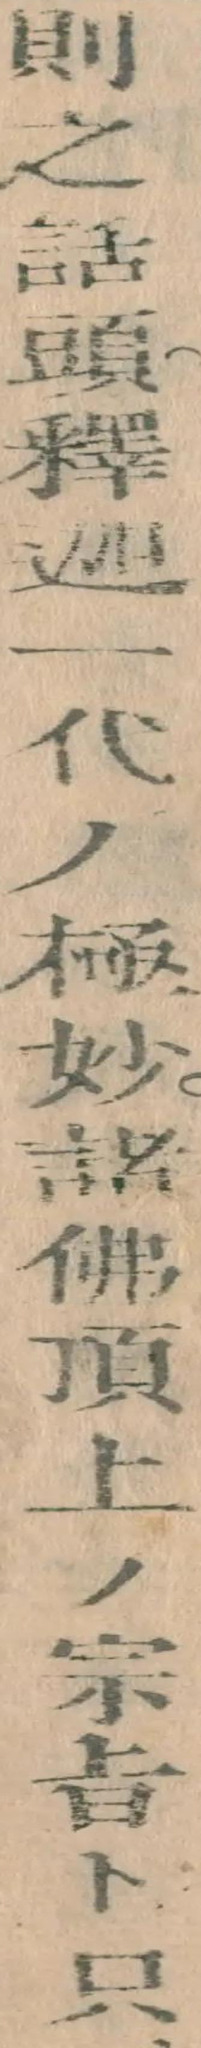則之話頭。釈迦一代ノ極妙。諸仏頂上ノ宗旨ト只
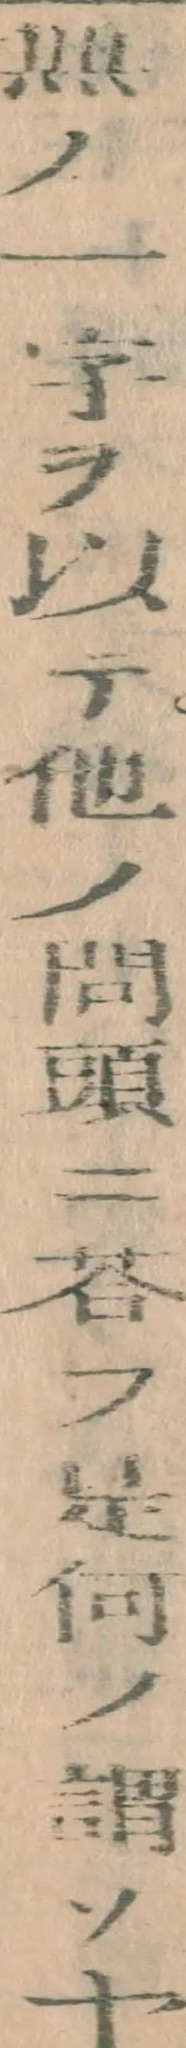無ノ一字ヲ以テ。他ノ問頭ニ荅フ是何ノ謂ソヤ。
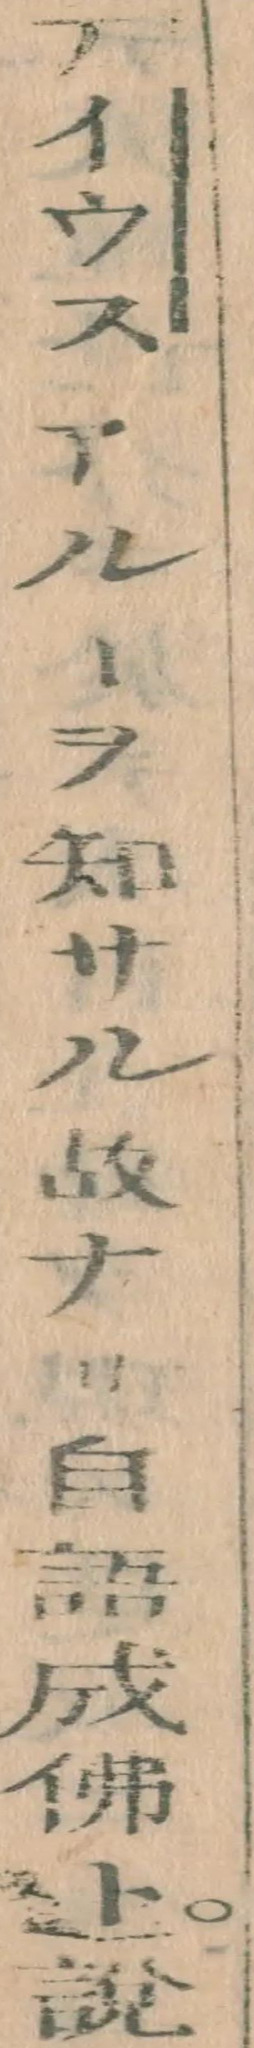デイウスアルーヲ知サル故ナリ自語成仏ト。説
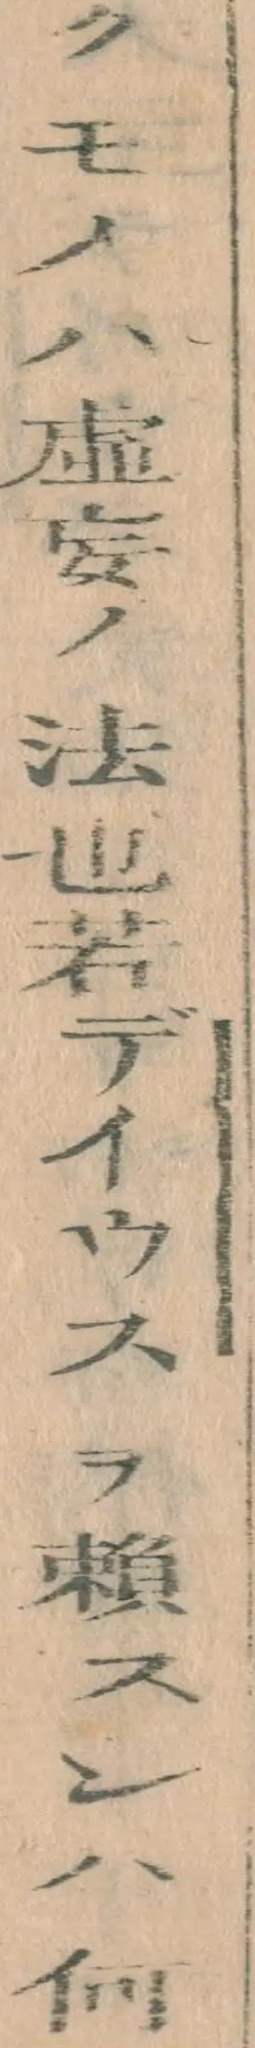クモノハ。虚妄ノ法也若デイウスヲ頼スンハ何
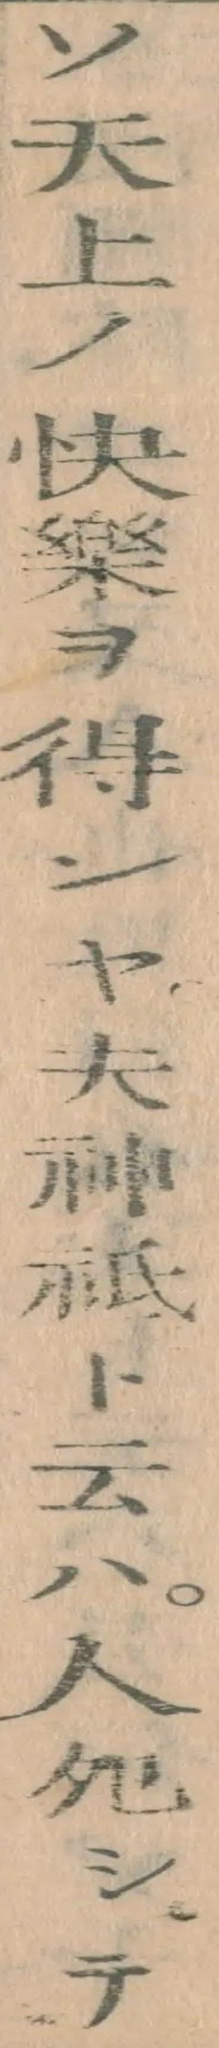ソ天上ノ快楽ヲ得ンヤ夫神祗ト云ハ。人夗シ。テ
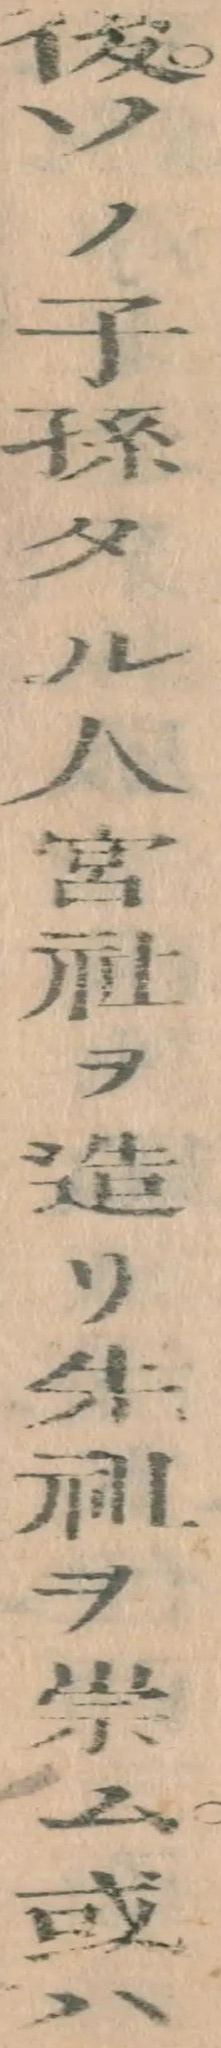後。ソノ子孫タル人宮社ヲ造リ先祖ヲ崇ム。或ハ
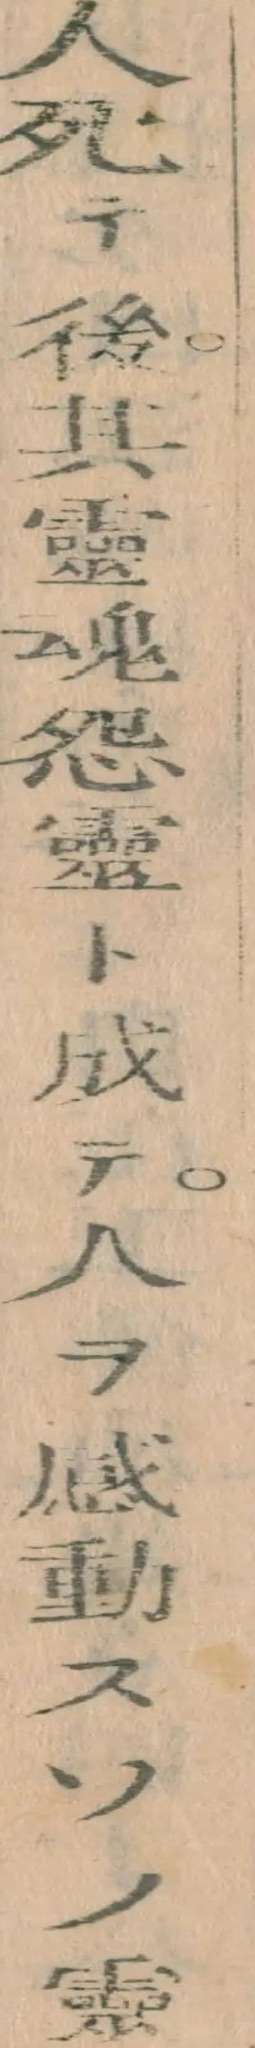人死テ後。其霊魂怨霊ト成テ。人ヲ感動スソノ霊
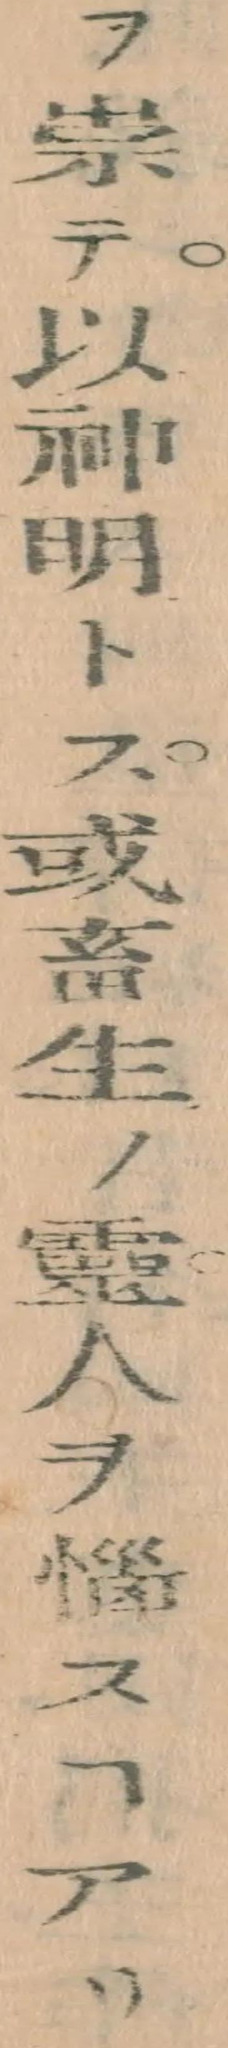ヲ崇テ。以神明トス。或畜生ノ霊。人ヲ悩スヿアリ
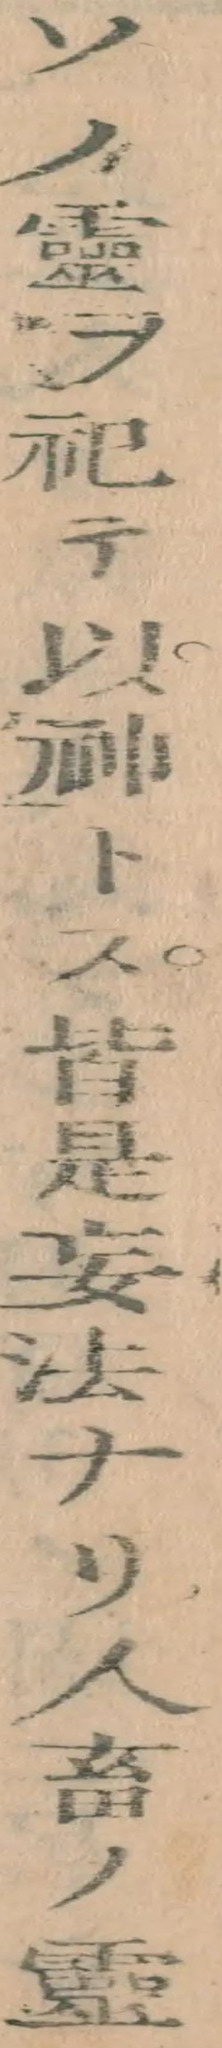ソノ霊ヲ祀テ以。神トス。皆是妄法ナリ人畜ノ霊
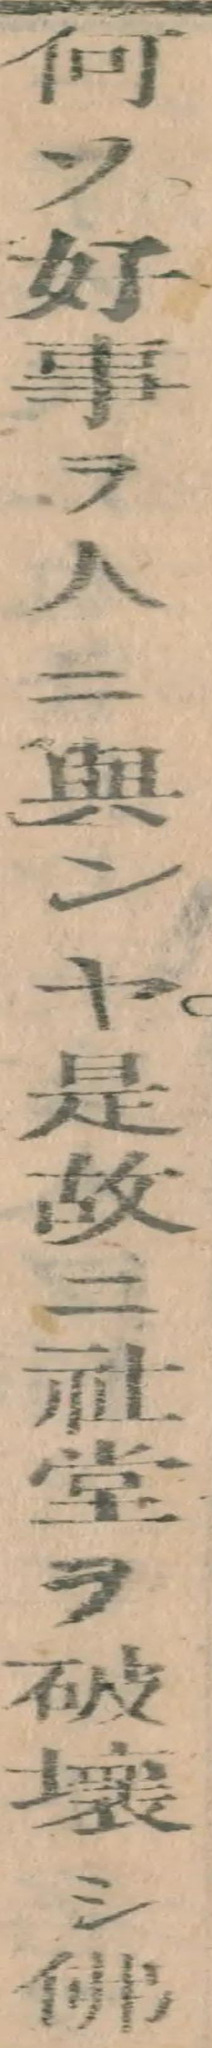何ソ。好事ヲ人ニ与ンヤ。是故ニ社堂ヲ破壊シ仏
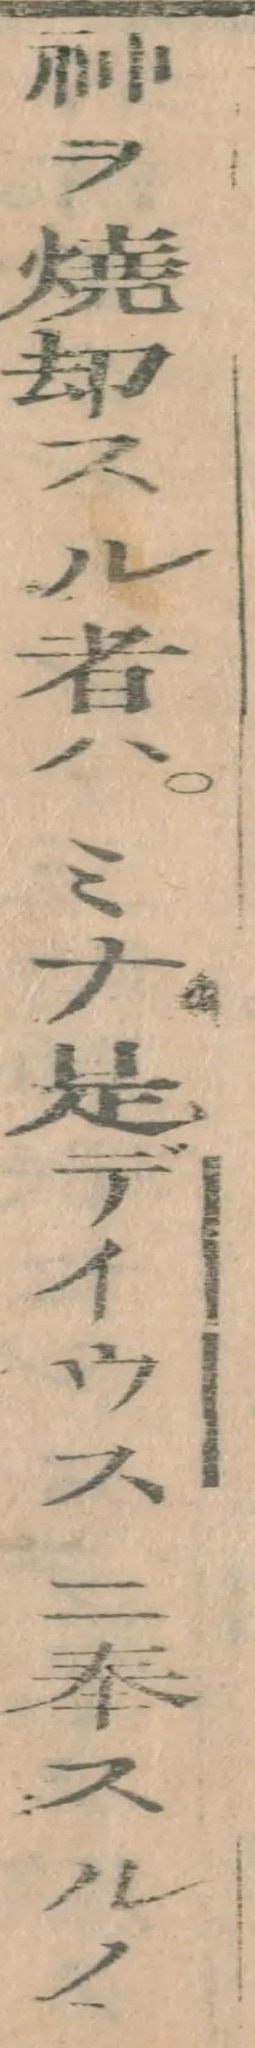神ヲ焼却スル者ハ。ミナ是デイウスニ奉スルノ
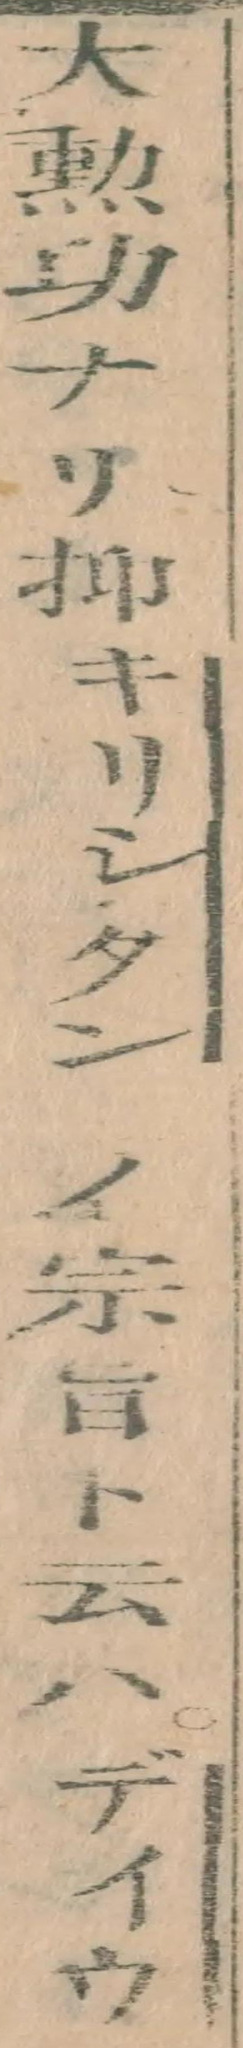大勲功ナリ。抑キリシタンノ宗旨ト云ハ。デイウ
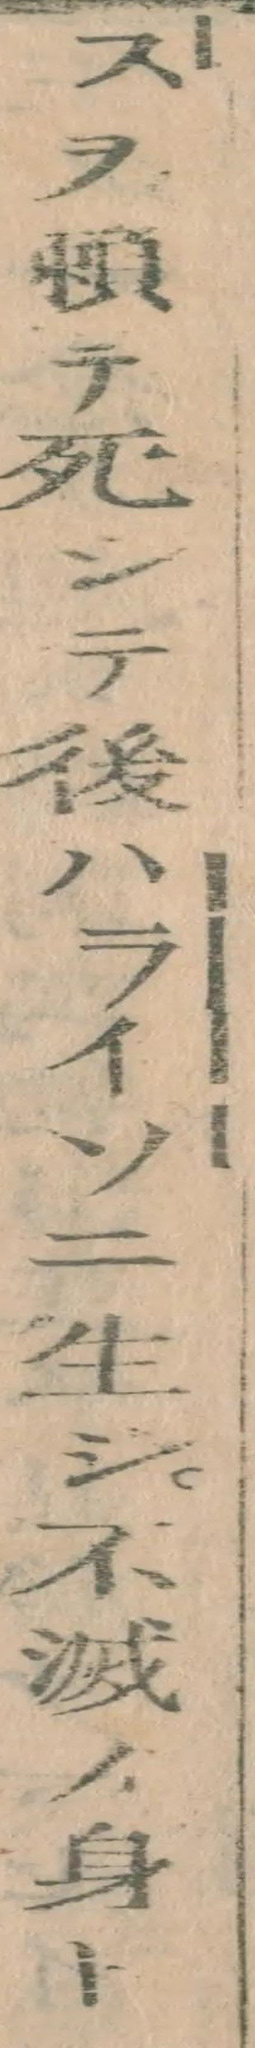スヲ頼テ死シテ後ハライソニ生シ。不滅ノ身ト
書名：南蛮寺興廃記
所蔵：国立国会図書館 National Diet Library, JAPAN
